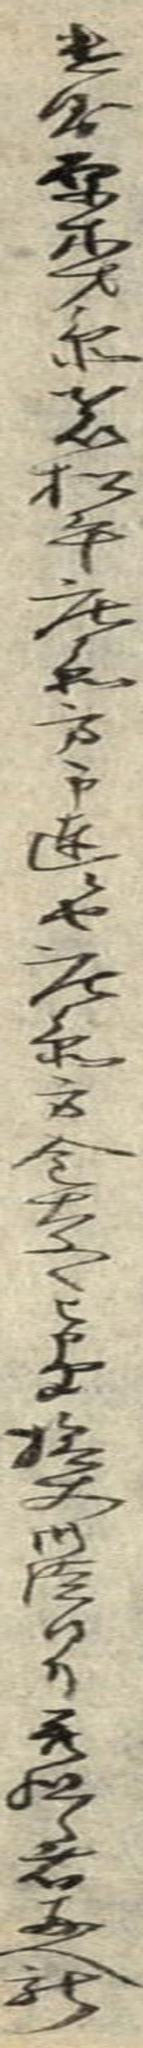遣則厚木才兵衛を以松平庄兵衛方へ申達候由庄兵衛方金大夫へ被申聞検使御徒目付并組之者両人新
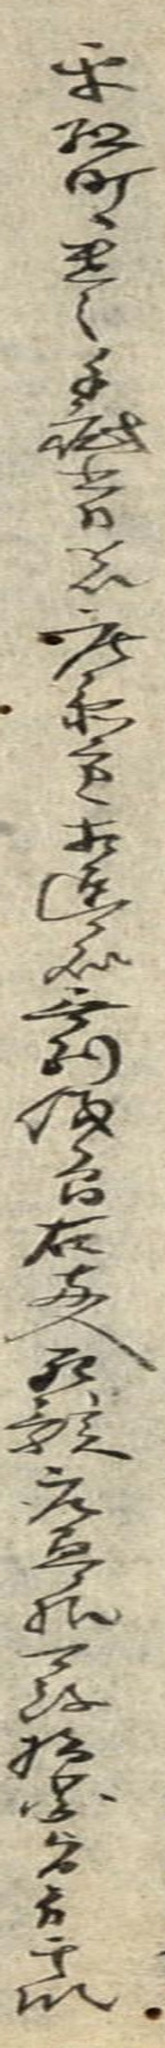平組町へ遣之手疵書付を以庄兵衛方へ相達候処無別儀候間右両人死骸取置候様可致指図旨に付其段
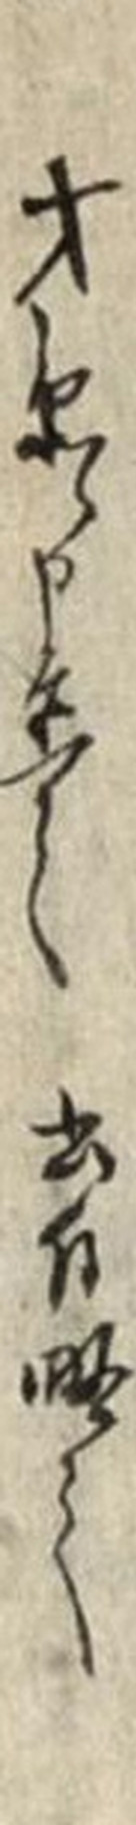才兵衛へ申達之書付略之
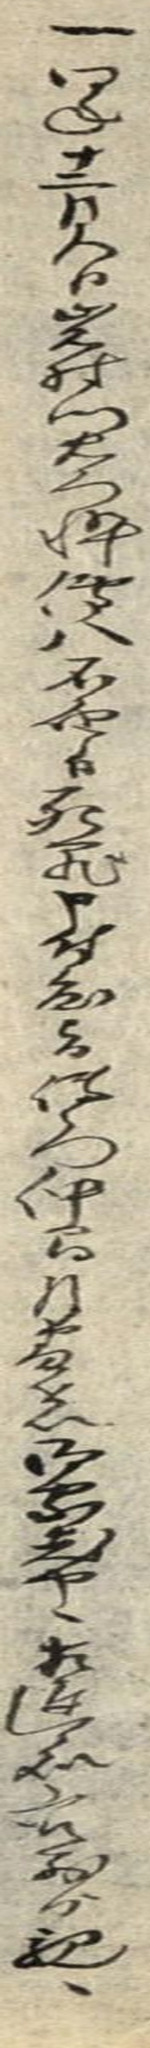一同年十二月八日岩村門右衛門忰伝八不届に付死罪申付度旨伝右衛門仲間月番を以御家老中へ相達候処最前ゟ親へ
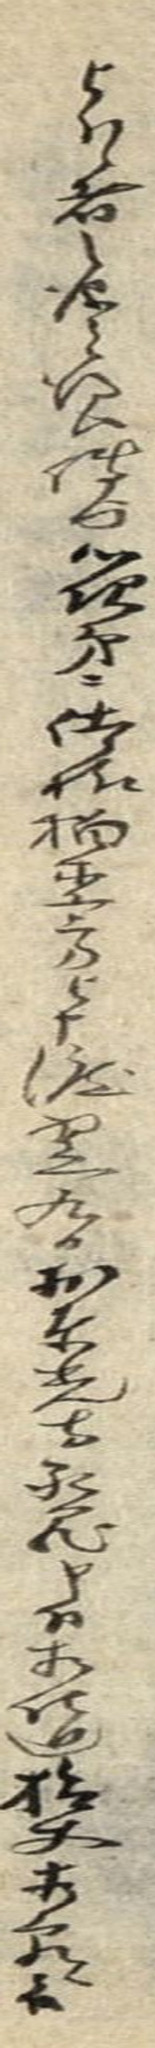被下候者之儀に候得は伝右衛門心次第に仕候様狛杢方被申渡翌九日於東光寺死罪申付相仕廻検使相願候に付
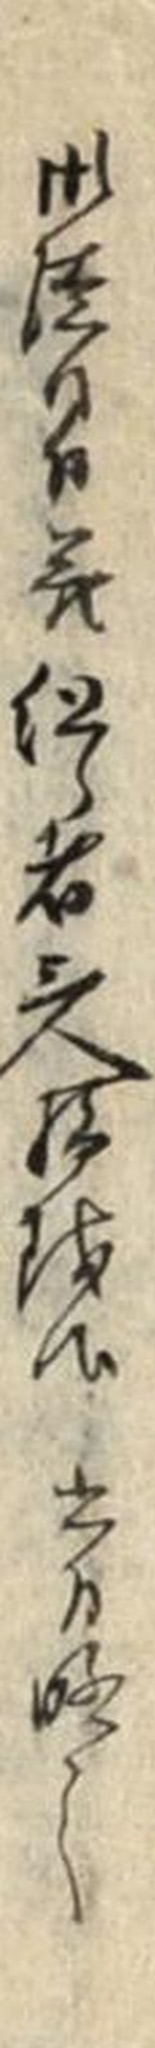御徒目付并組之者三人指越候書付略之
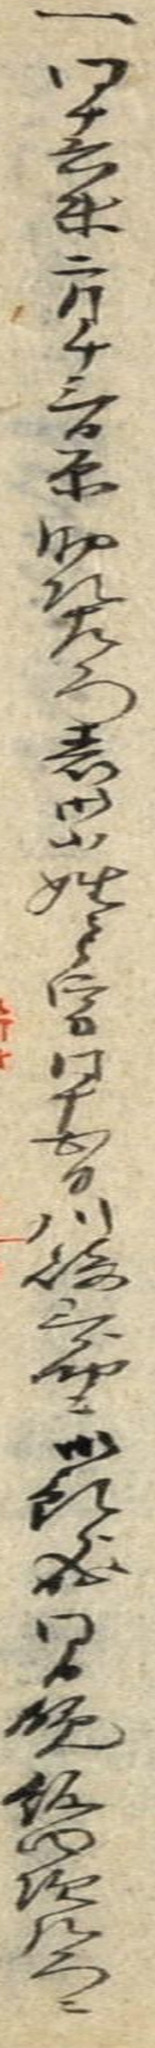一同十六未二月十三日原助次左衛門表御小姓に被仰付同十五日川崎三郎助に御預被成同日晩飯田次左衛門に

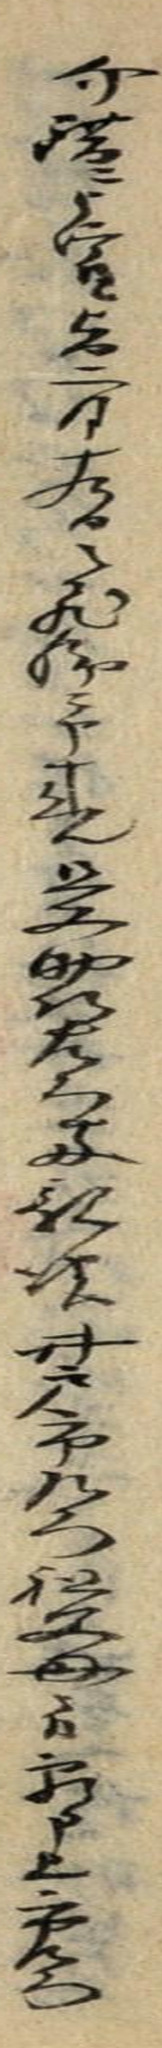介錯に被仰付候旨二月十九日之飛脚に申来ル且又助次左衛門両親儀は井戸市左衛門祖父母に付願申上市左衛門
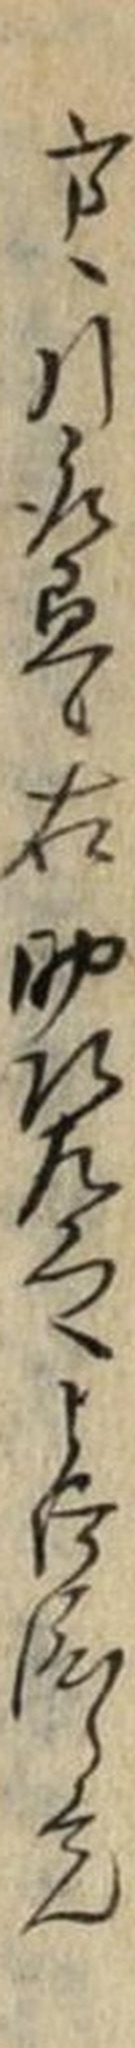方へ引取置候右助次左衛門へ被申渡候覚
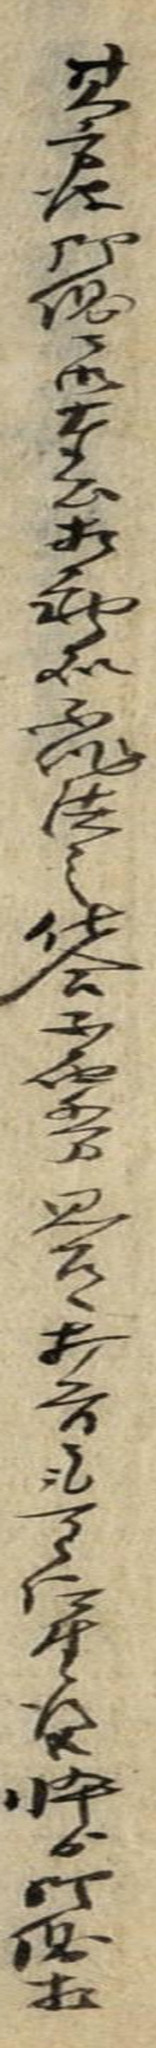其方儀御側に御奉公相勤候処不作法之仕合不届千万思召候打首にも可被仰付候得共忰ゟ御側相
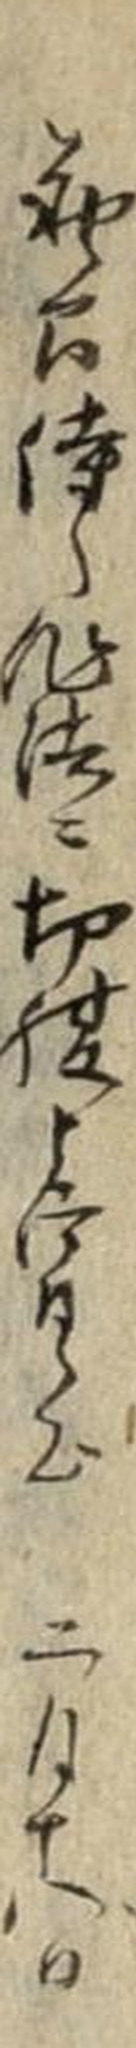勤候間侍之作法に切腹被仰付候以上二月十八日
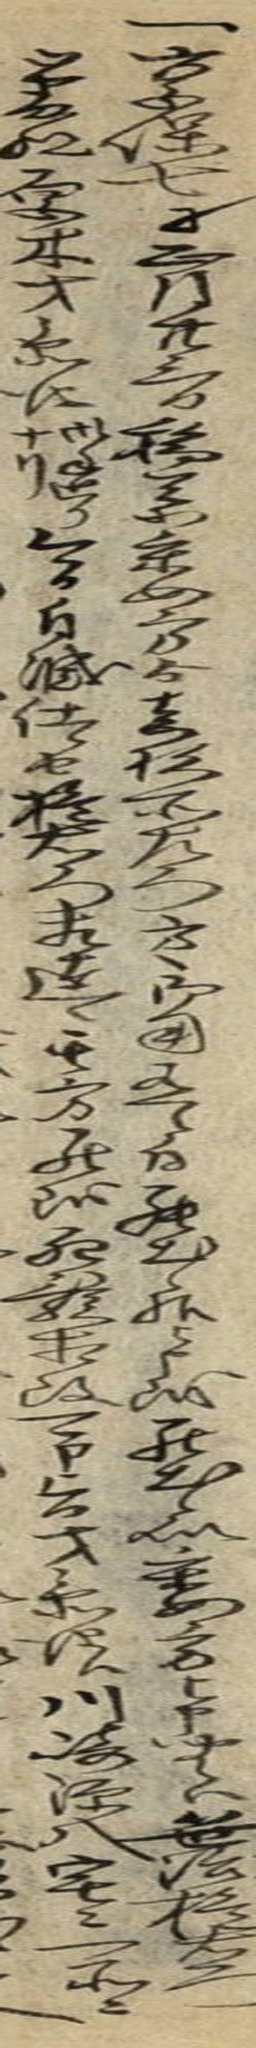御番組厚木才兵衛儀御手廻りナリ今日自滅仕候由権右衛門相達候其方罷越死骸相改可申旨才兵衛儀は川崎源八宅に一所に
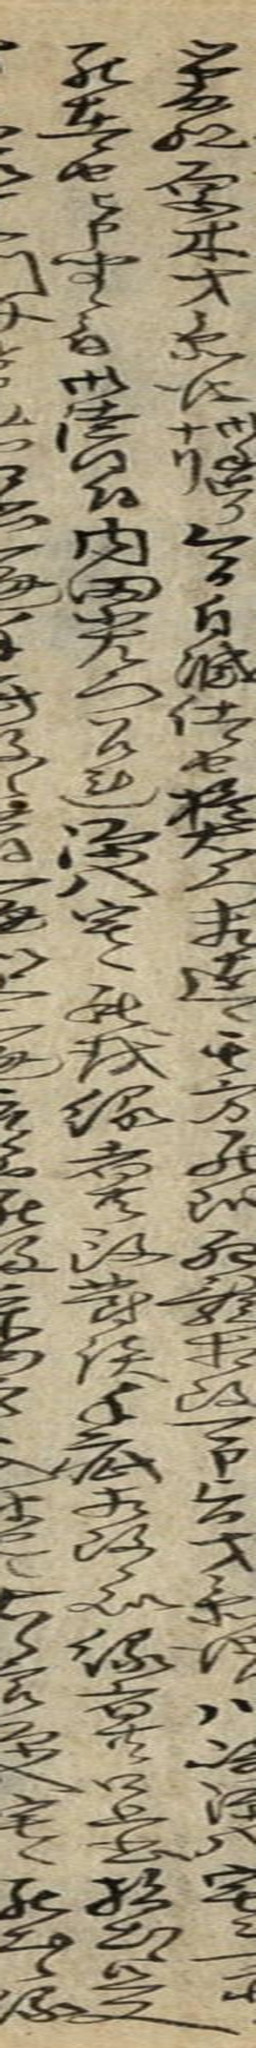罷在候由被申聞候に付御徒目付内田小左衛門召連源八宅へ罷越縁者共致対談手疵相改候処縁者共口上書指出候且又
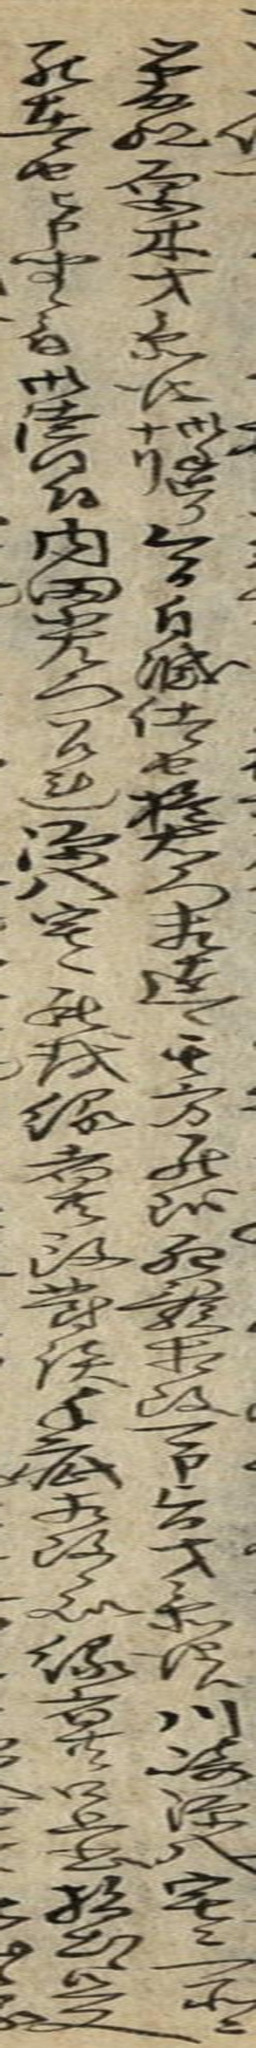罷在候由被申聞候に付御徒目付内田小左衛門召連源八宅へ罷越縁者共致対談手疵相改候処縁者共口上書指出候且又
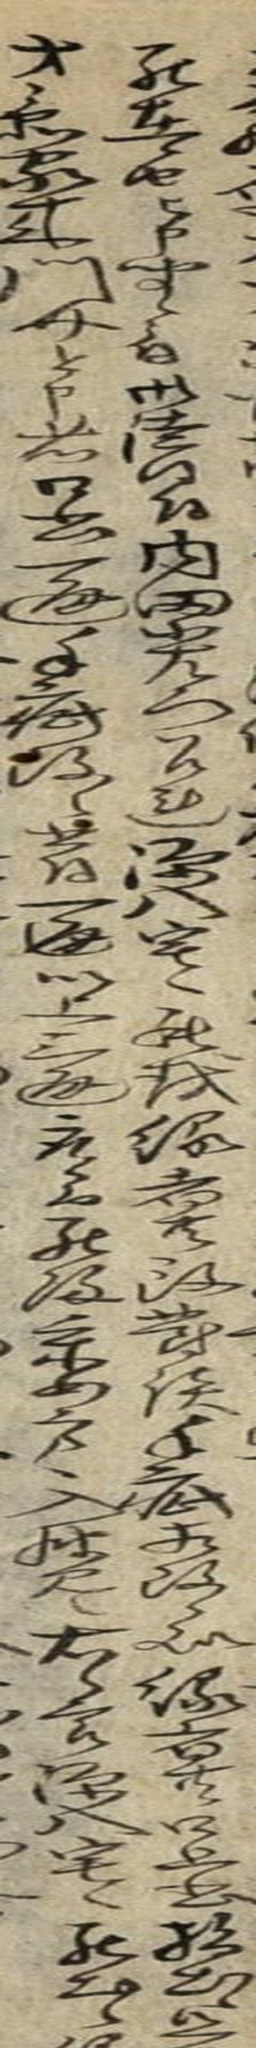才兵衛家来門介と申者口書一通手疵改之書付一通以上三通取候て罷帰采女方へ入披見候右之節源八宅へ罷出候縁
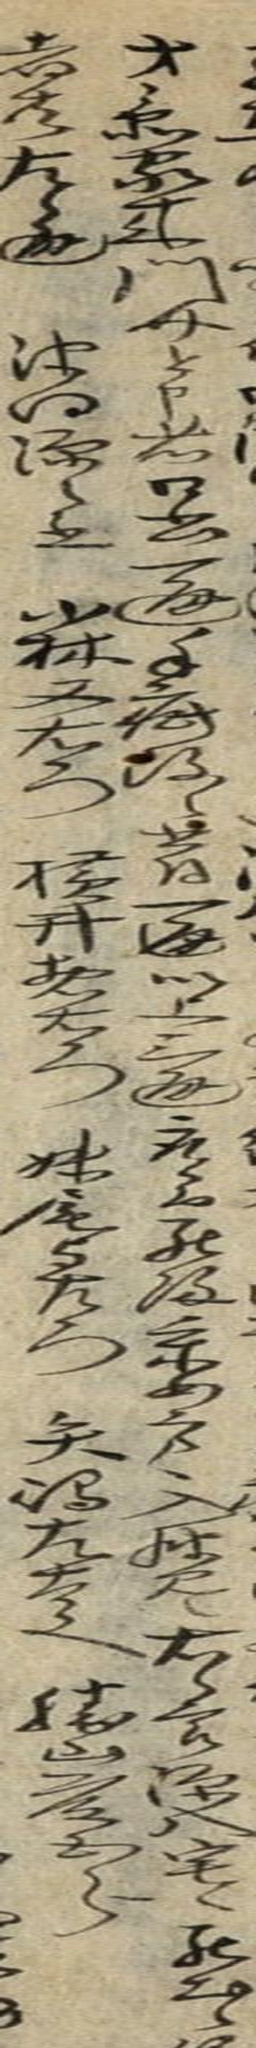者共左之通津田源之丞小林又右衛門横井惣右衛門妹尾与左衛門矢島左大夫勝山藤五郎
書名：御停止異変死失
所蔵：福井県文書館 Fukui Prefectural Archives
